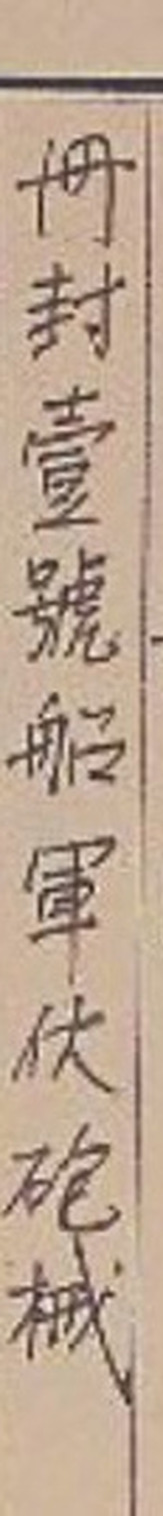冊封壱号船軍伙砲械
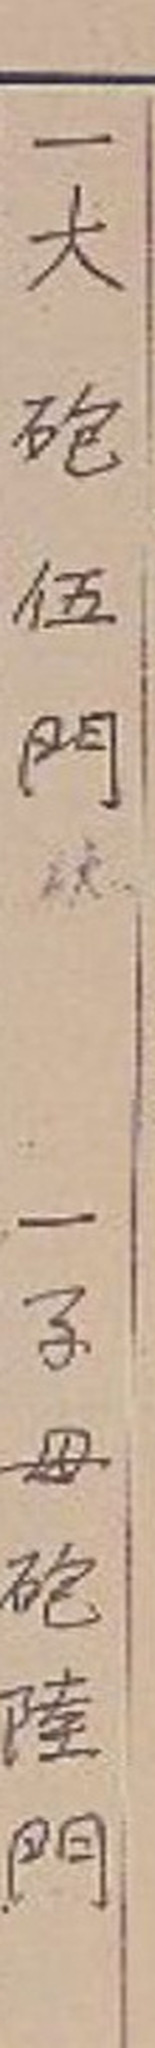一大砲伍門一子母砲陸門
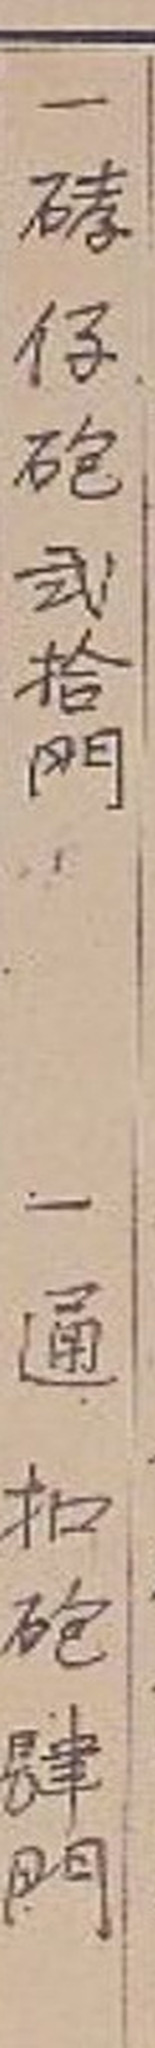一硣仔砲弐拾門一通扣砲肆門
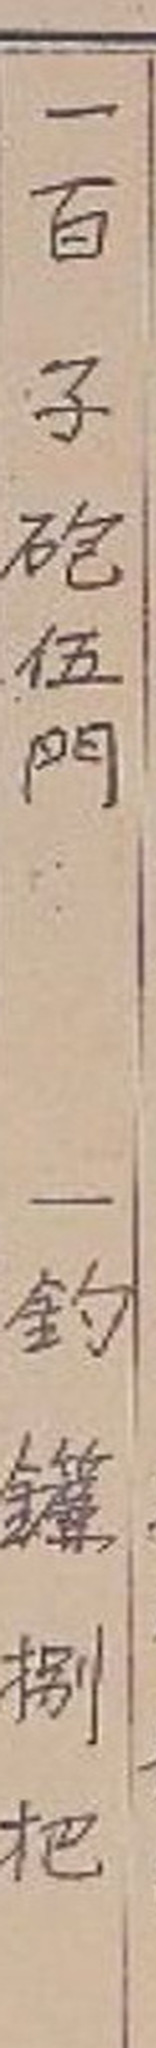一百子砲伍門一釣捌把
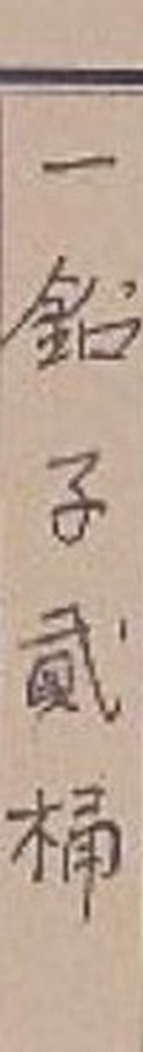一鉛子弐桶

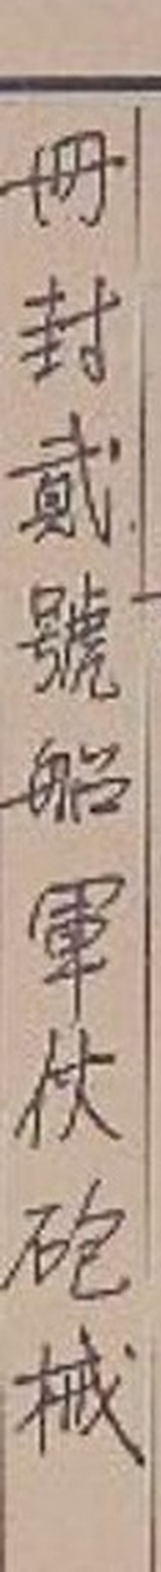冊封弐号船軍伙砲械
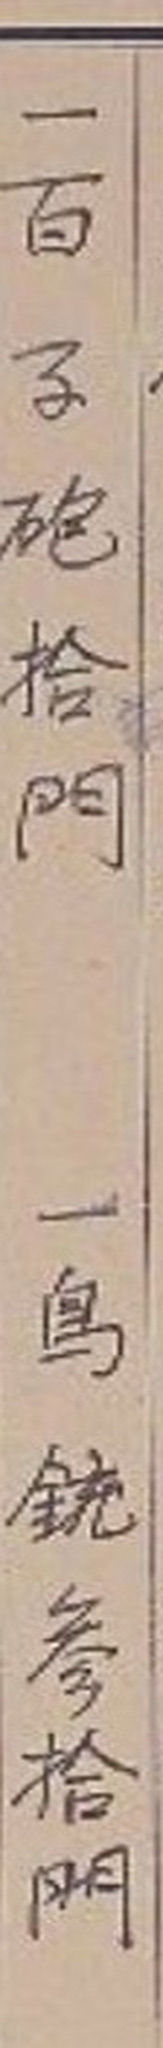一百子砲拾門一鳥銃参拾門
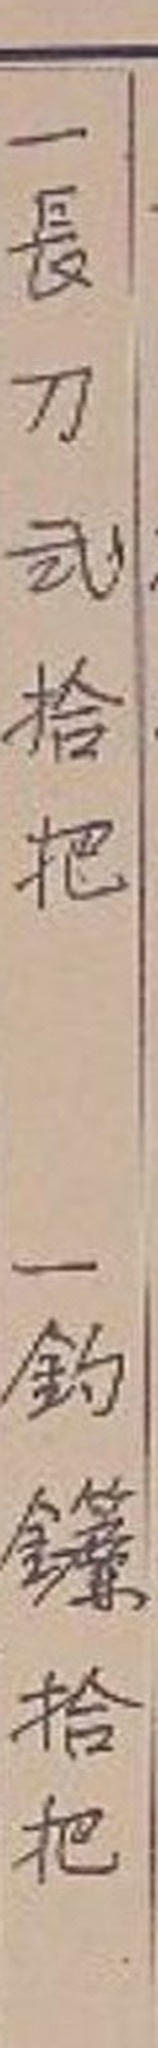一長刀弐拾把一釣拾把
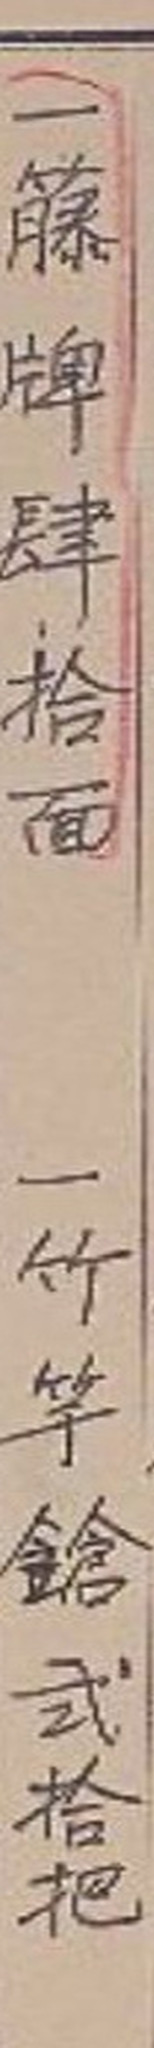一藤牌肆拾面一竹竿鎗弐拾把
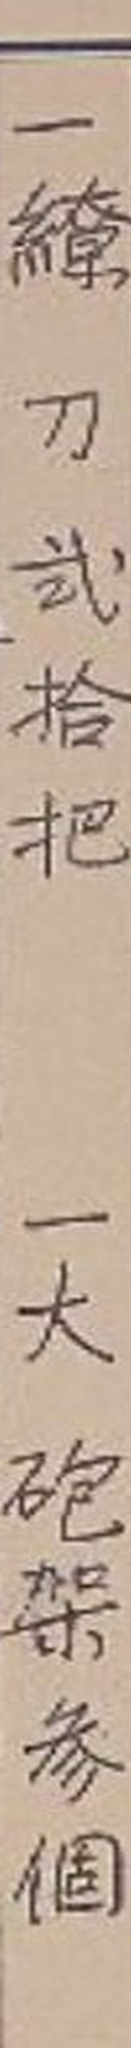一繚刀弐拾把一大砲架参個
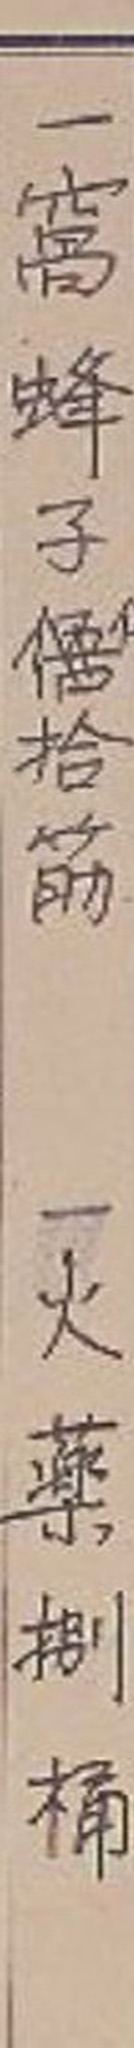一窩蜂子伍拾筋一火薬捌桶
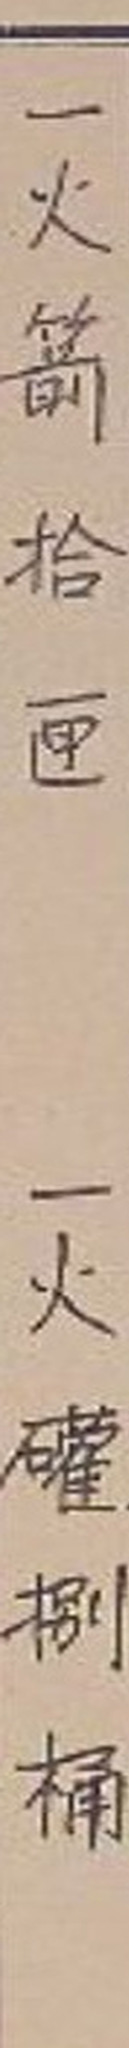一火箭拾匣一火礶捌桶
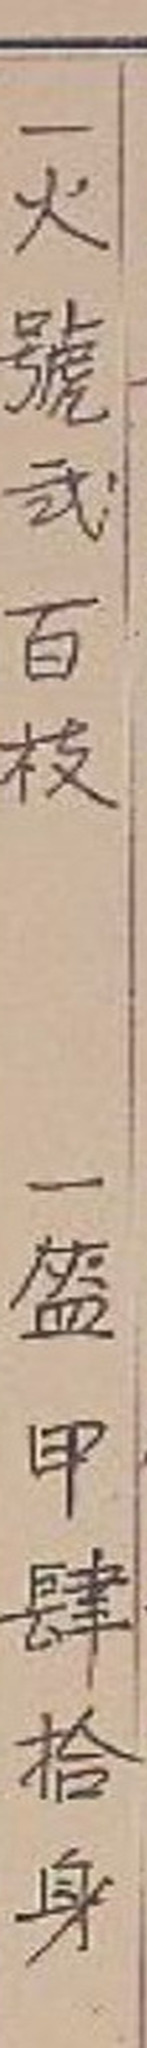一火号弐百枝一盔甲肆拾身
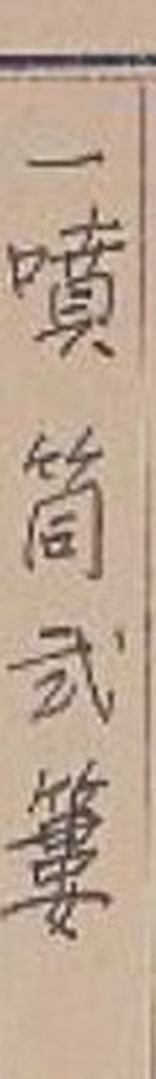一噴筒弐簍
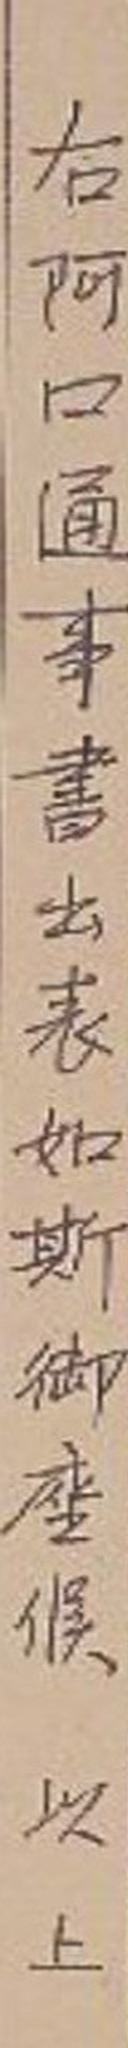右阿口通事書出表如斯御座候以上
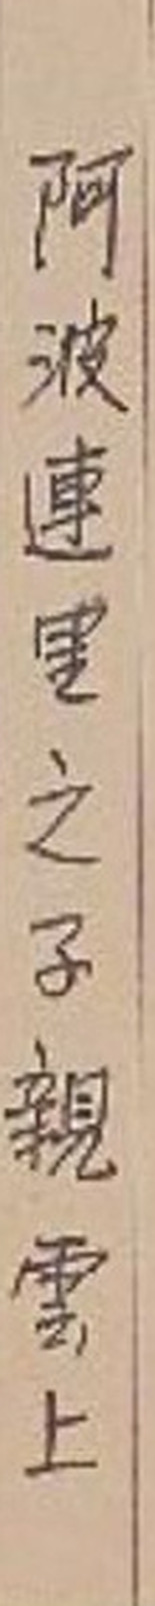阿波連里之子親雲上
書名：支那冊封使来琉諸記 下巻
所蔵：University of the Ryukyus Library
